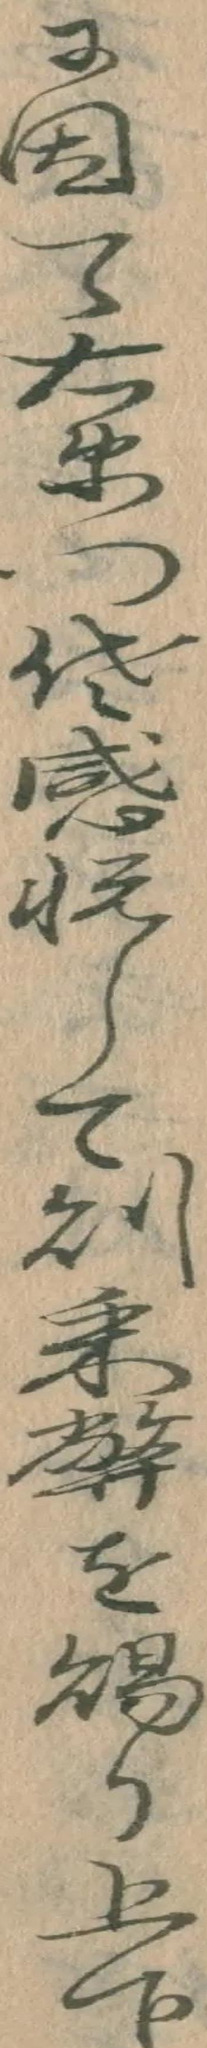尓固て右衛門佐感悦して則采幣を賜り上下
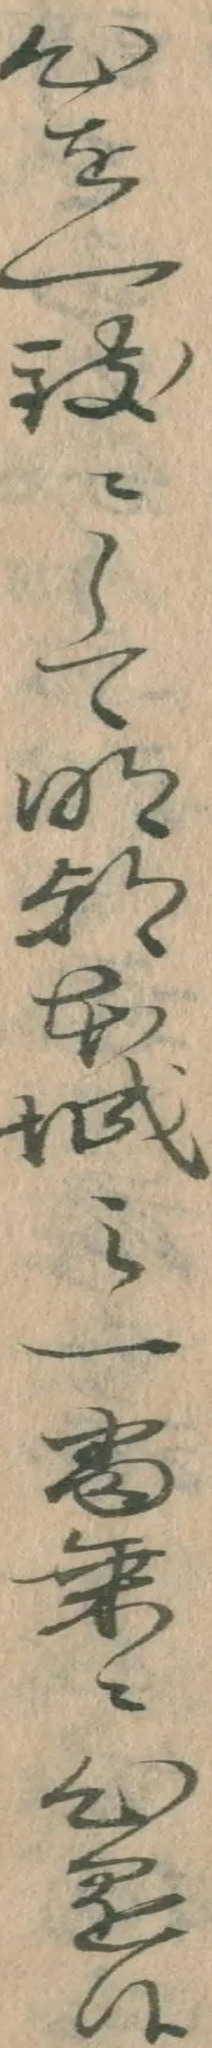心を一致にして明朝本城之一番乗に心懸候
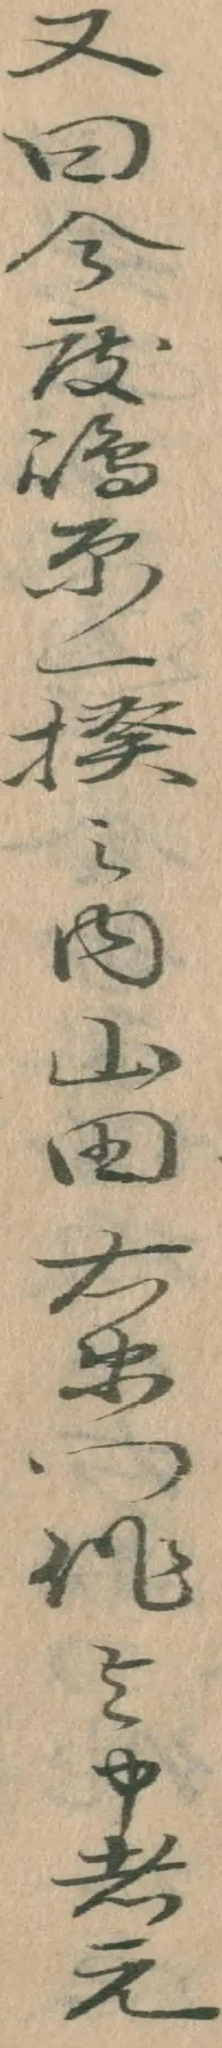又曰今度島原一揆之内山田右衛門作与申者元
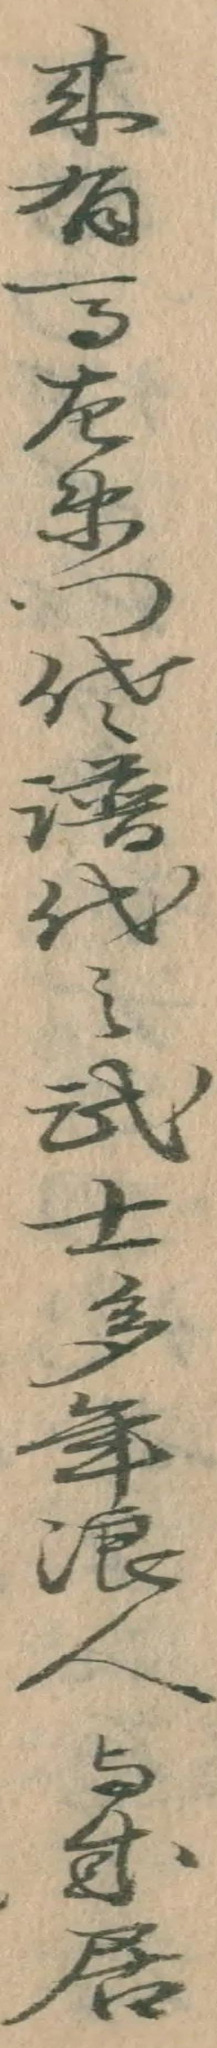来有馬左衛門佐譜代之武士多年浪人与成居
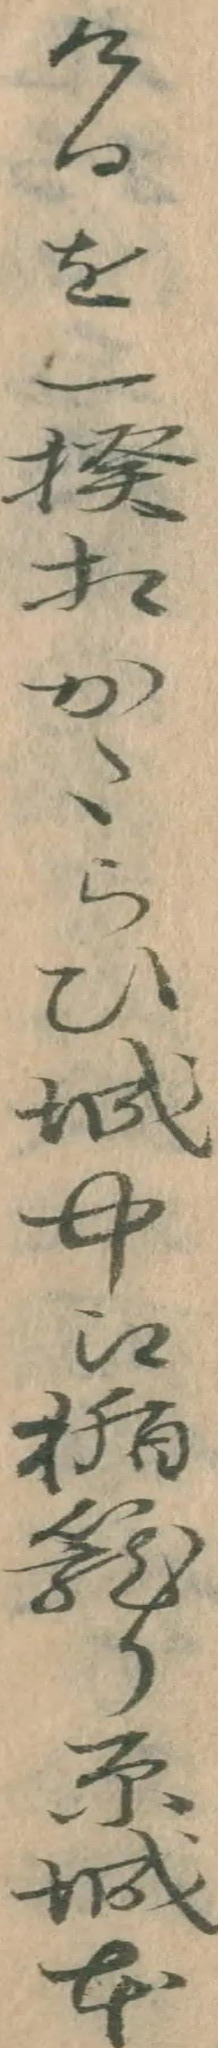けるを一揆相かたらひ城中江楯籠り原城本

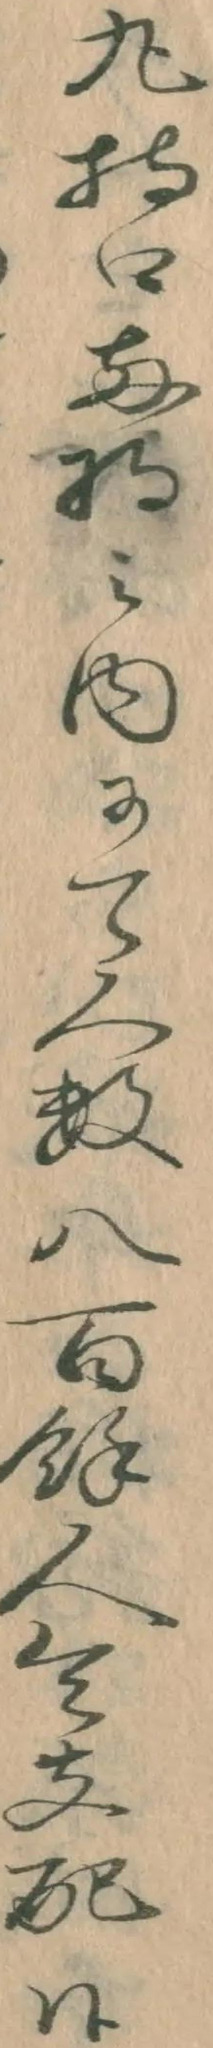丸持口両将之内尓て人数八百余人令支配候
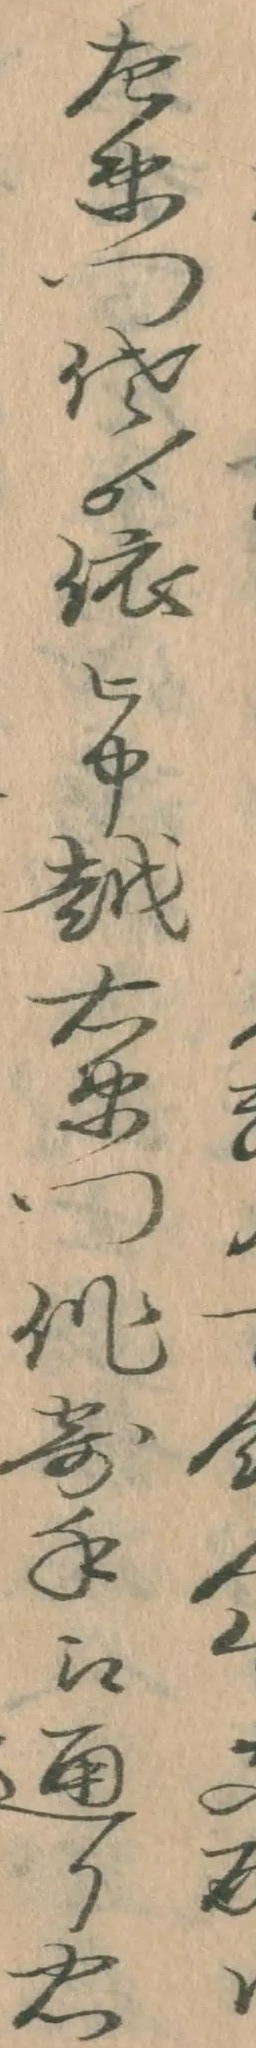左衛門佐ゟ依被申越右衛門作寄手江通り忠
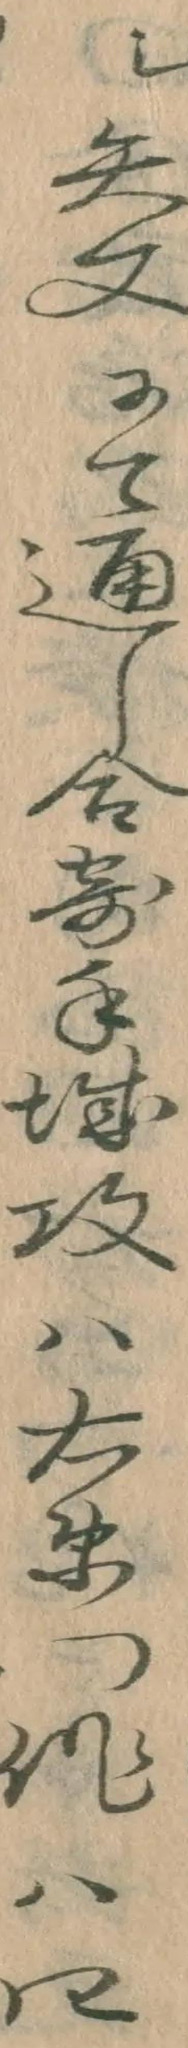し矢文尓て通し合寄手城攻は右衛門作は四
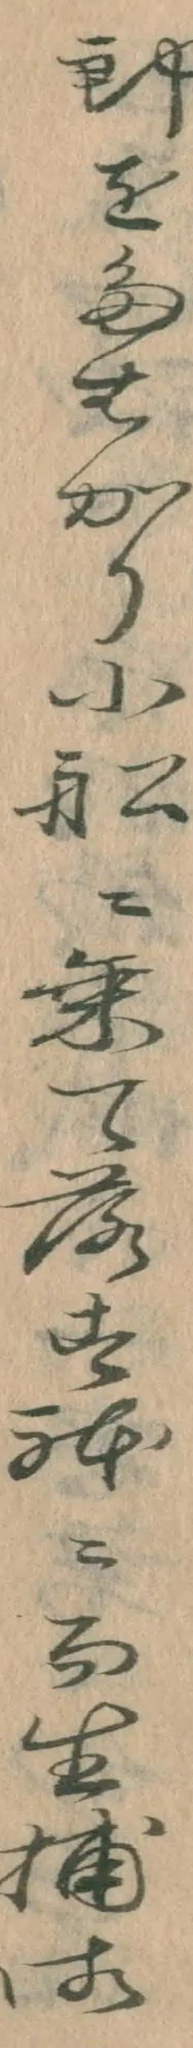郎を多者加り小舩に乗て落春躰に而生捕御
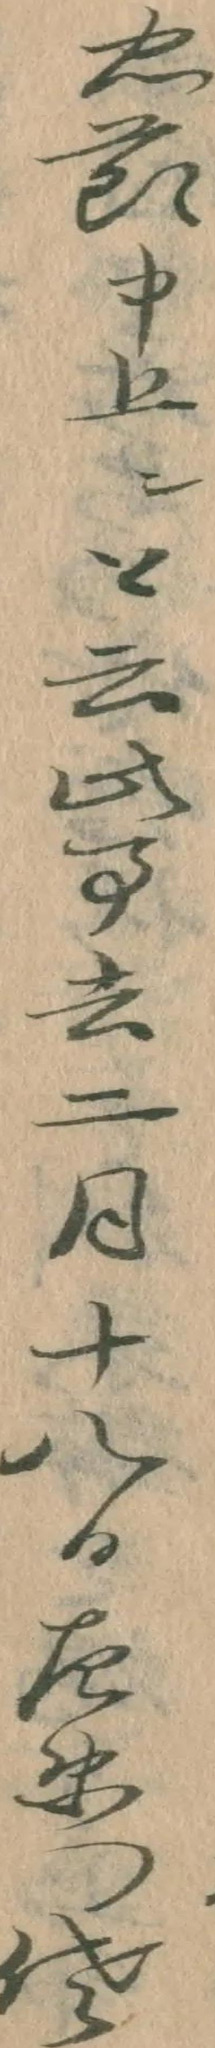忠節申上しと云此事去二月十八日左衛門佐
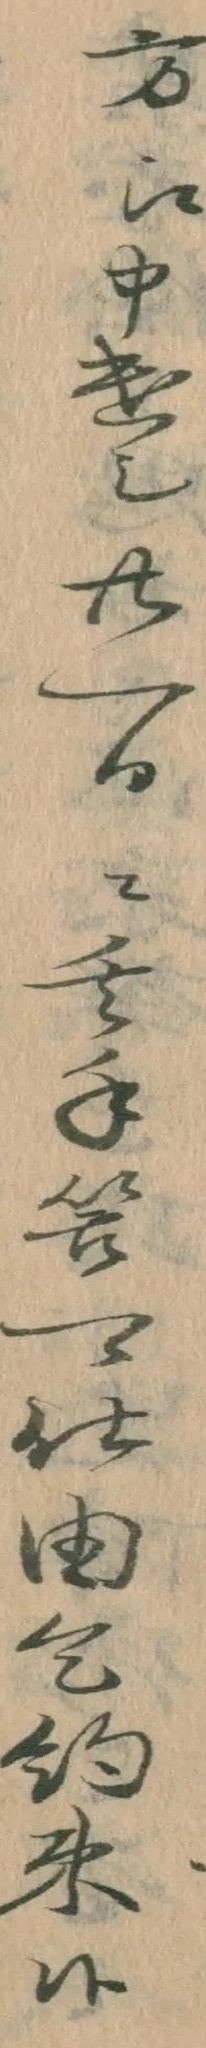方江申遣し廿一日に其手筈可仕由乞約束候
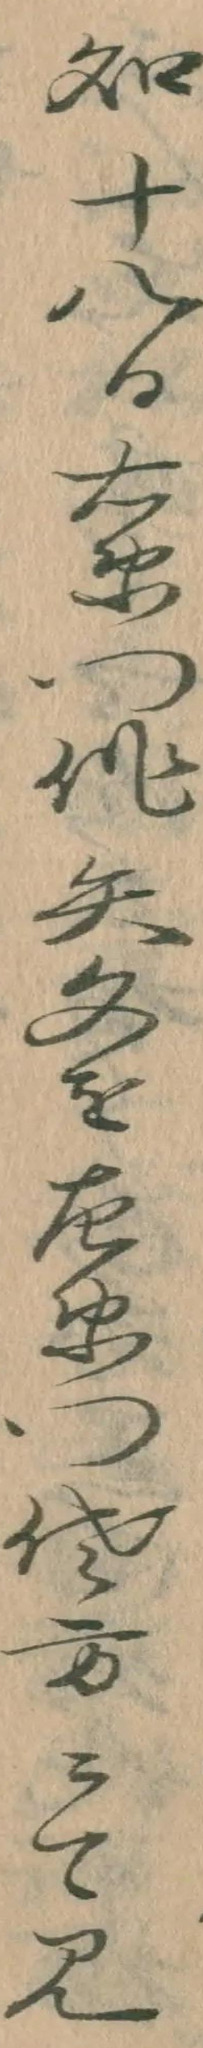処十八日右衛門作矢文を左衛門佐方にて見
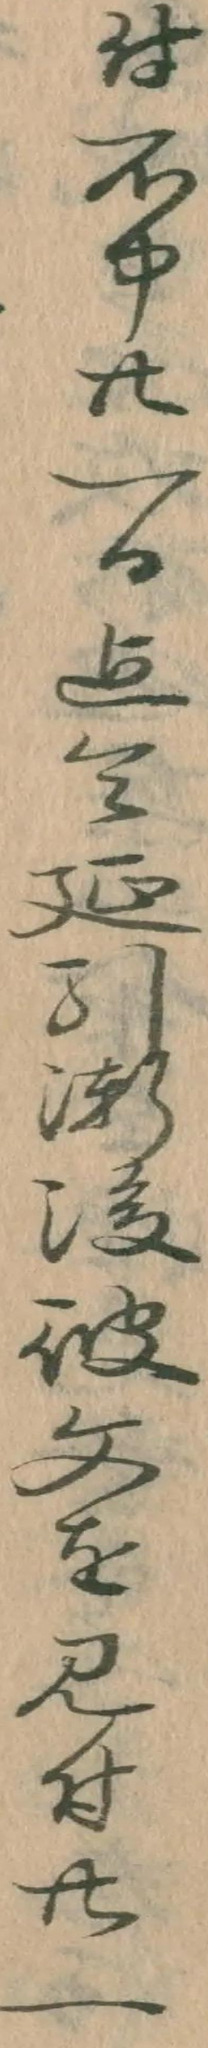付不申廿一日迄令延引漸後彼父を見付廿一
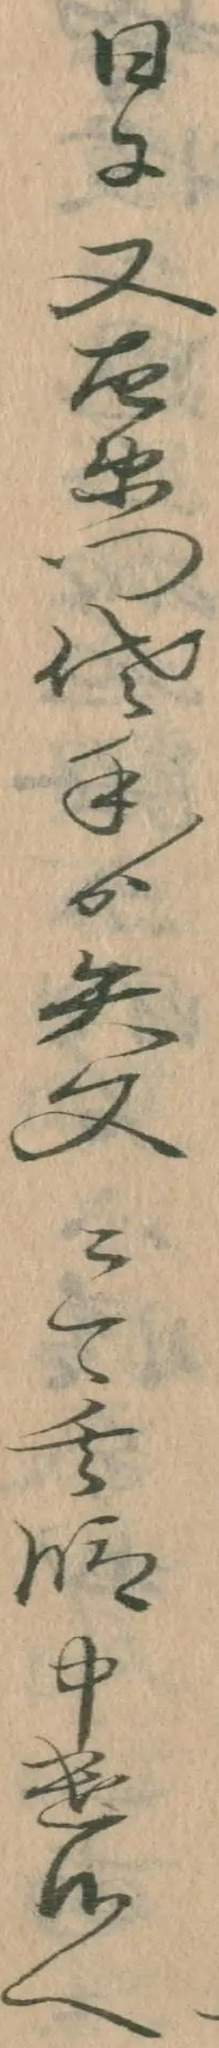日尓又左衛門佐手ゟ矢文にて其段申遣候へ
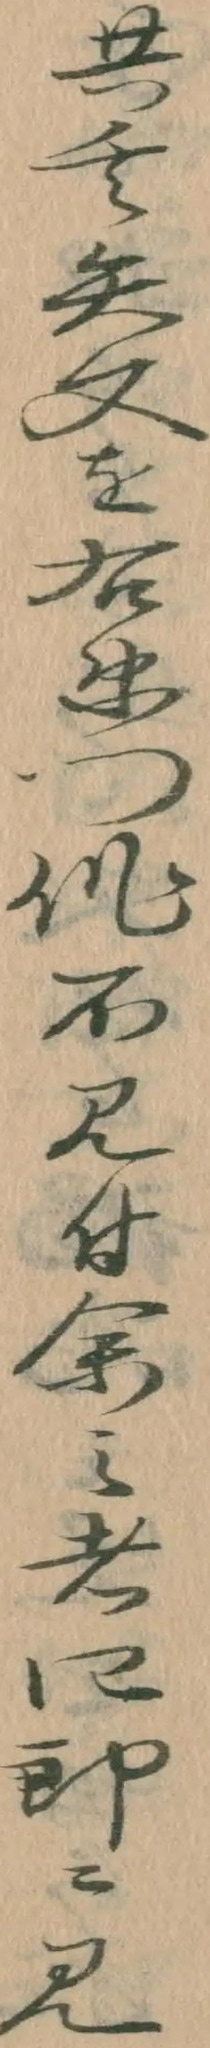共其矢文を右衛門作不見付余之者四郎に見
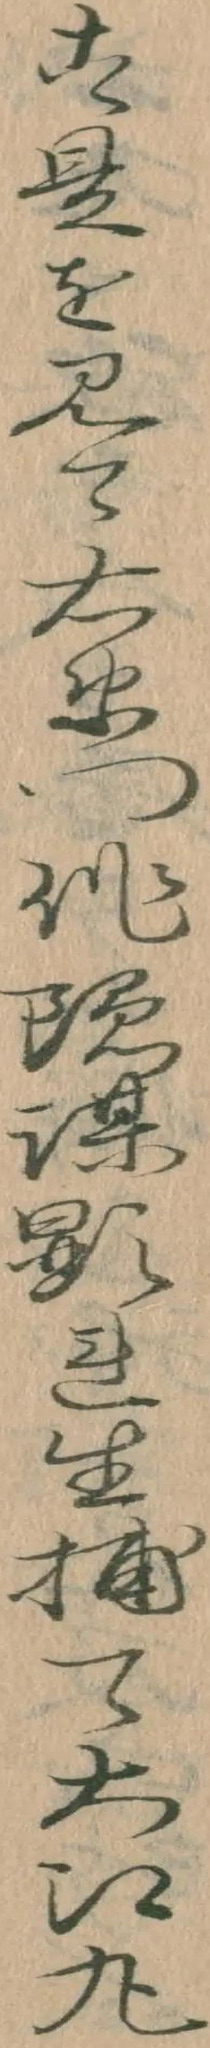春是を見て右衛門作隠謀顕連生捕て大江丸
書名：切支丹御退治記 49巻. [7]
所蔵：国立国会図書館 National Diet Library, JAPAN
